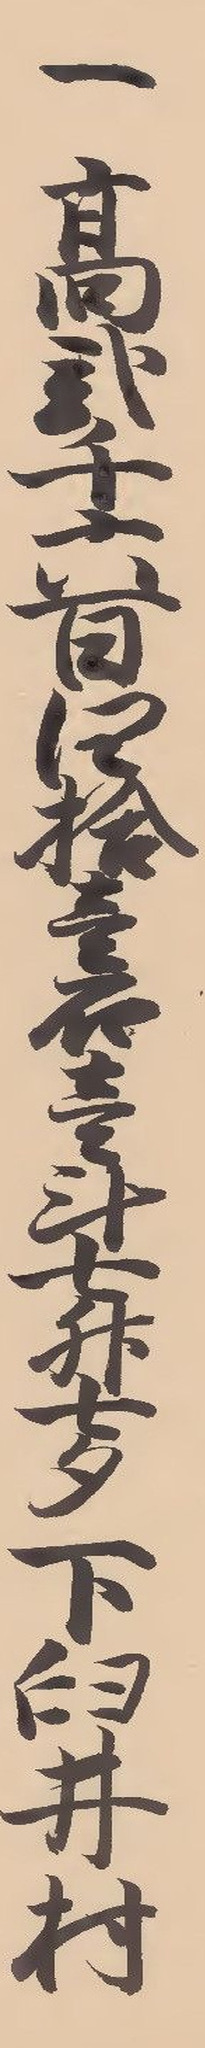一高弐千六百四拾壱石壱斗七升七勺下臼井村
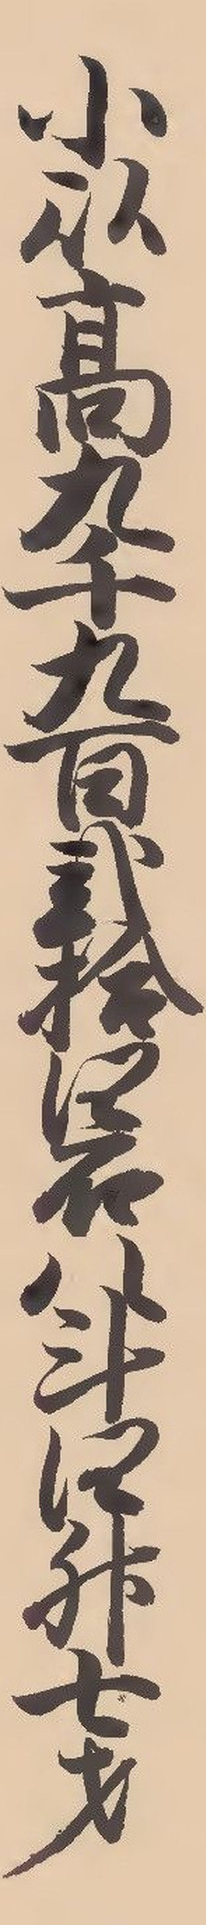小以高九千九百弐拾四石八斗四升七才
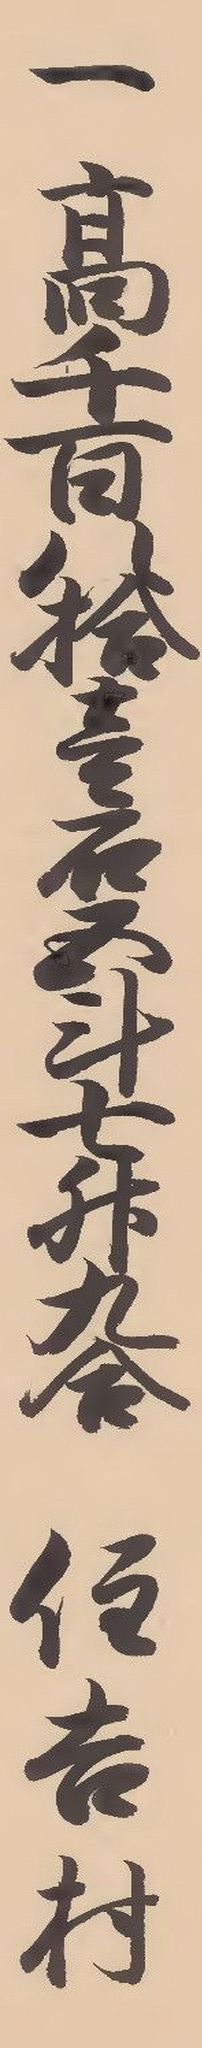一高千百八拾壱石五斗七升九合住吉村
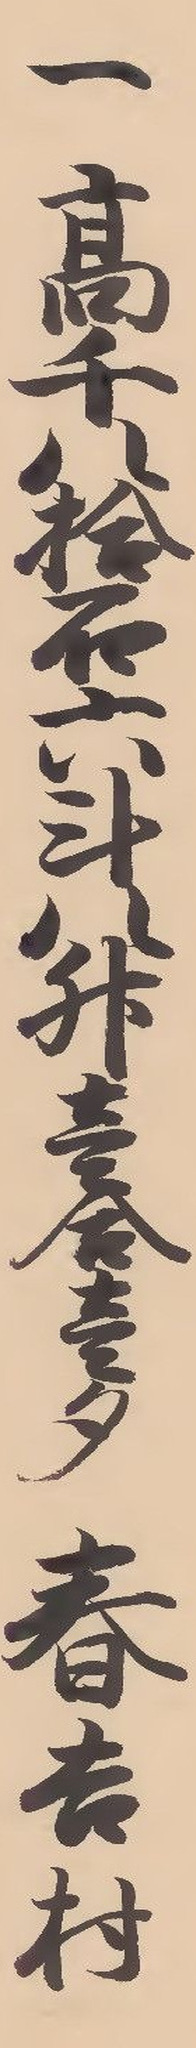一高千八拾石六斗八升壱合壱勺春吉村

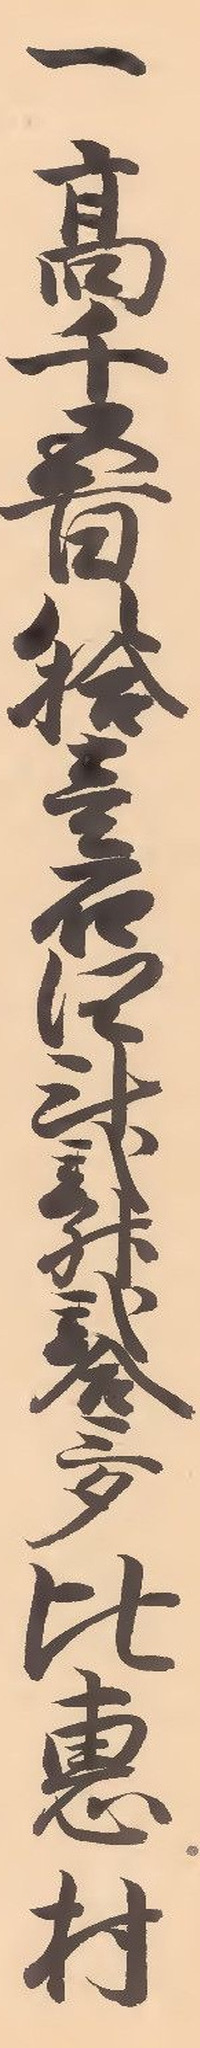一高千五百八拾壱石四斗弐升弐合三勺比恵村
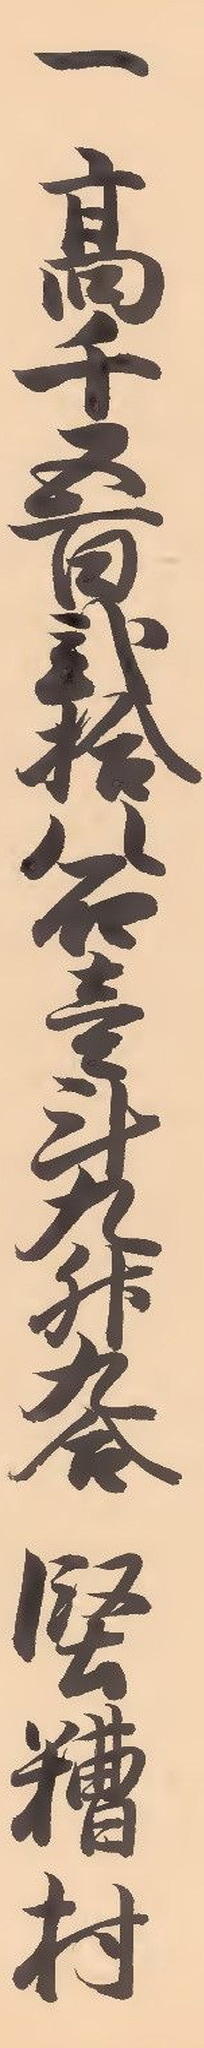一高千五百弐拾八石壱斗九升九合堅糟村
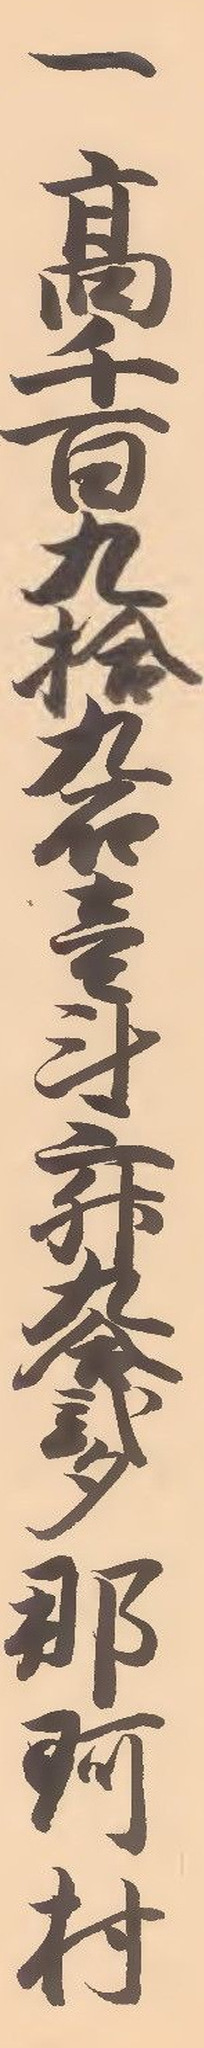一高千百九拾九石壱斗三升九合弐勺那珂村
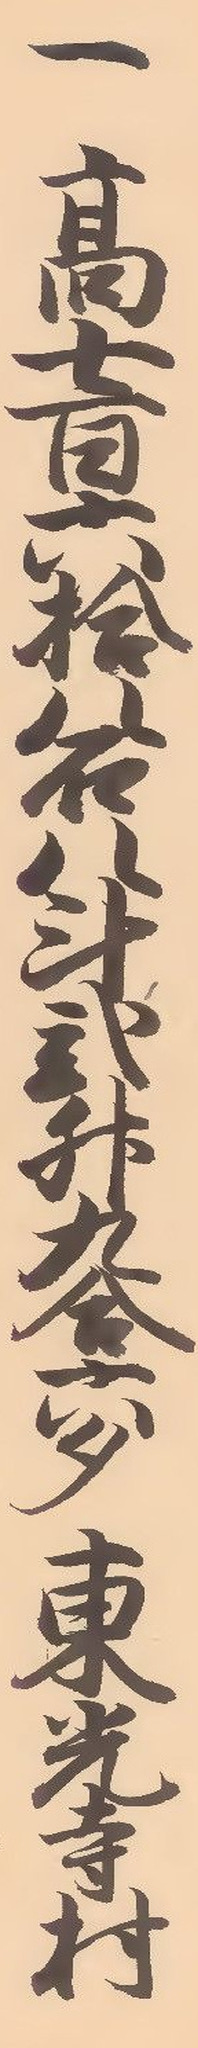一高七百六拾八石八斗弐升九合六勺東光寺村

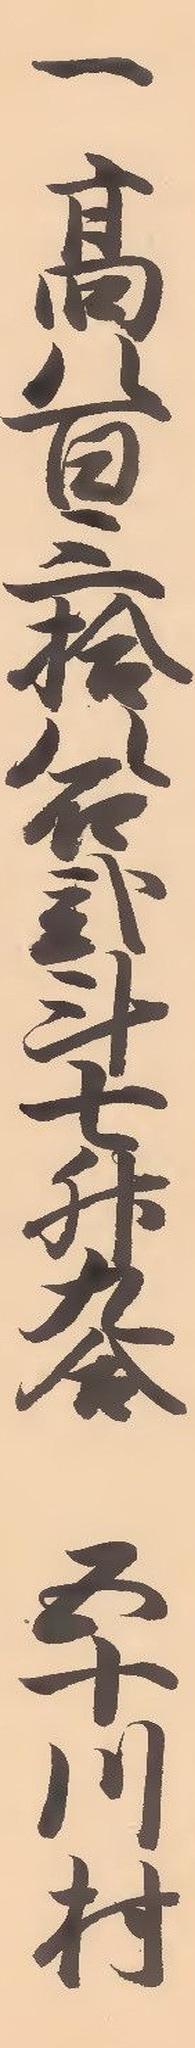一高八百三拾八石弐斗七升九合五十川村
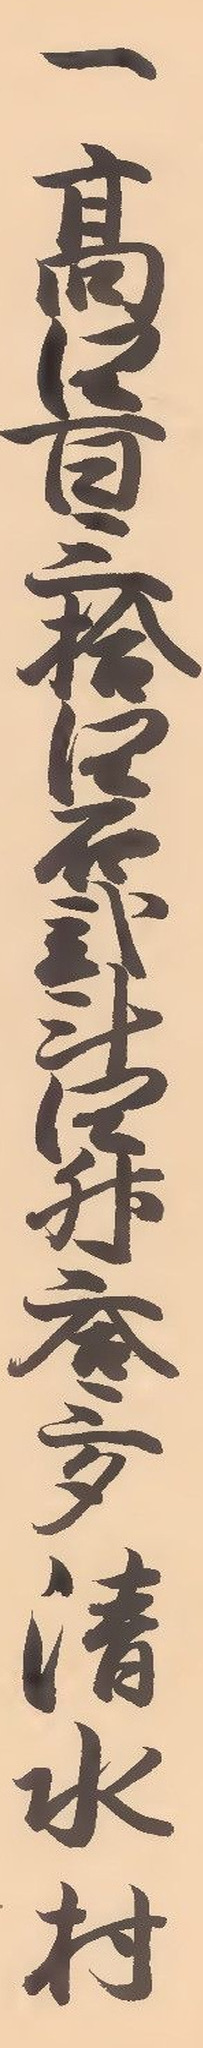一高四百三拾四石弐斗四升三合三勺清水村
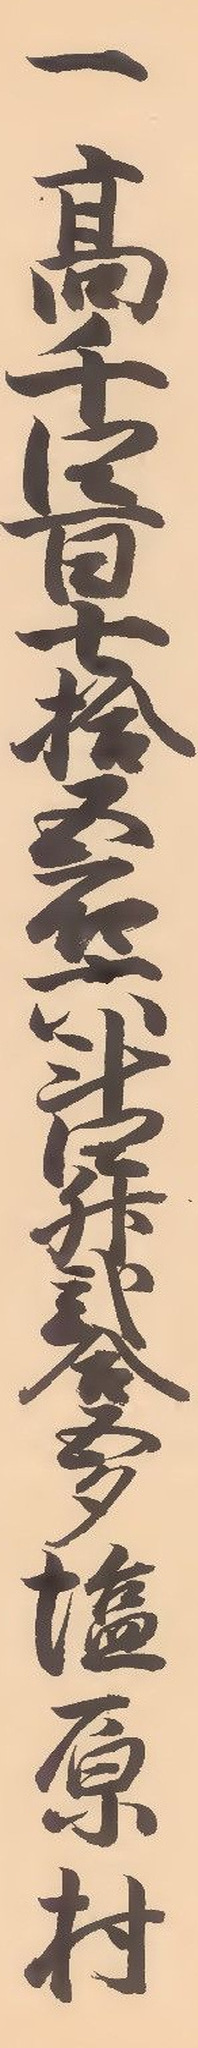一高千四百七拾五石六斗四升弐合五勺塩原村
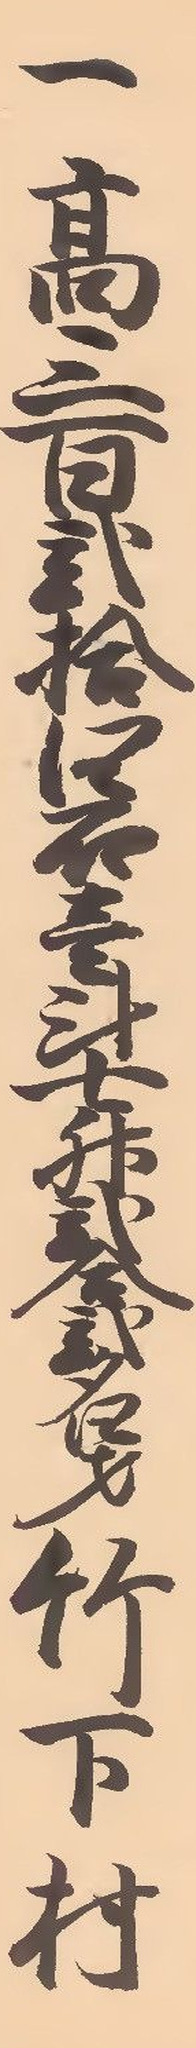一高三百弐拾四石壱斗七升弐合弐勺四才竹下村
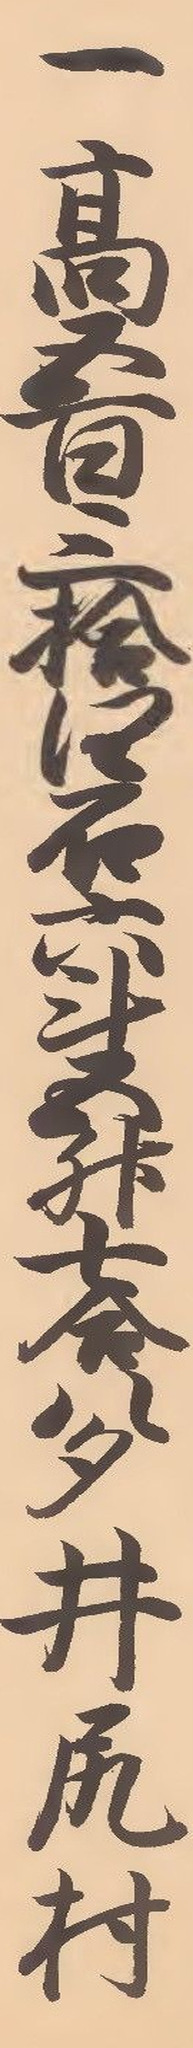一高五百三拾四石六斗五升七合八勺井尻村
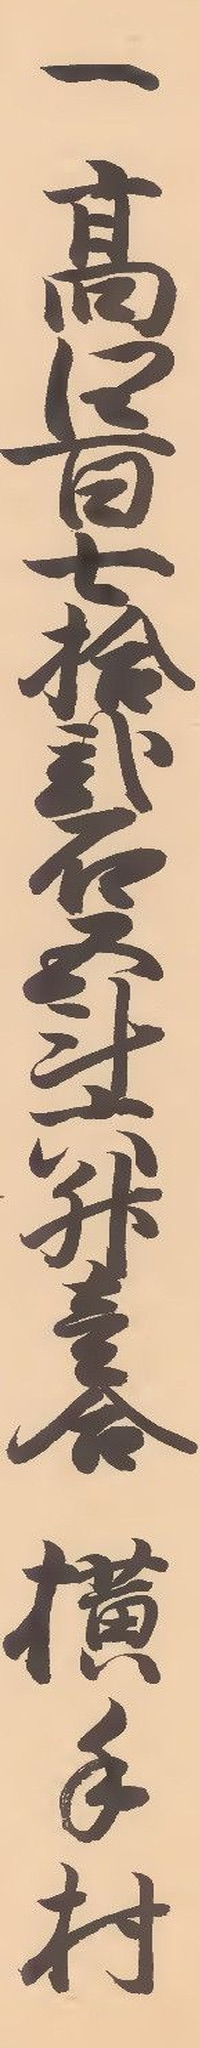一高四百七拾弐石五斗六升壱合横手村
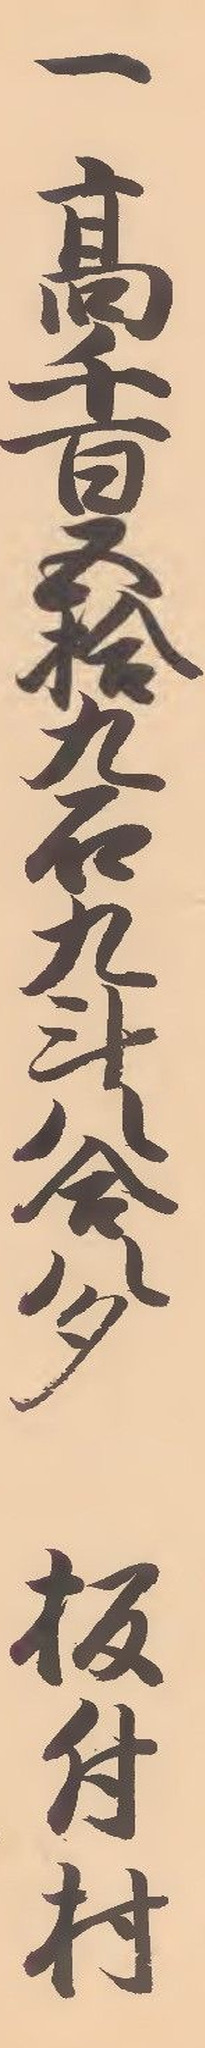一高千百五拾九石九斗八合八勺板付村

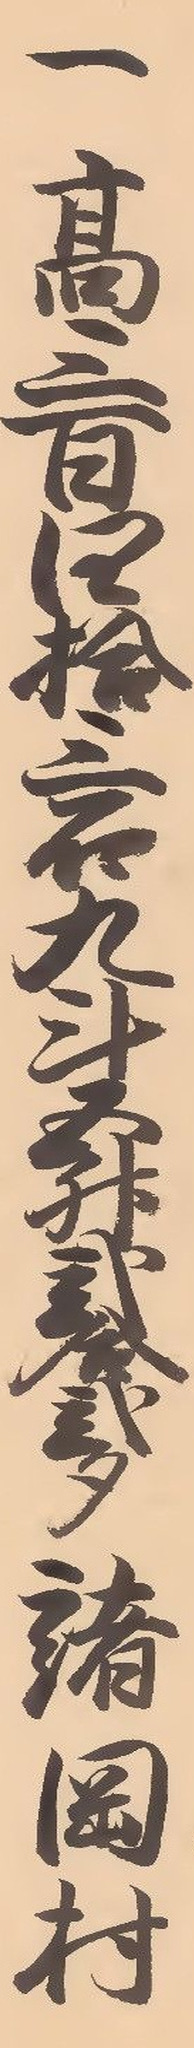一高三百四拾三石九斗五升弐合弐勺諸岡村
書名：筑前国郷帳
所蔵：国立公文書館 National Archives of Japan
